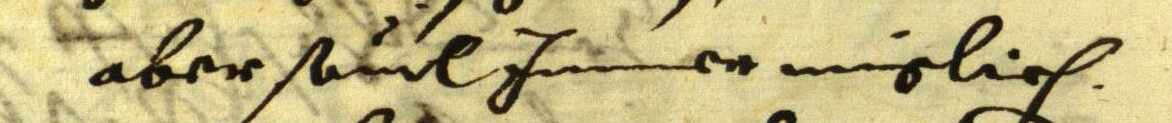aber soūil Immer miglich.
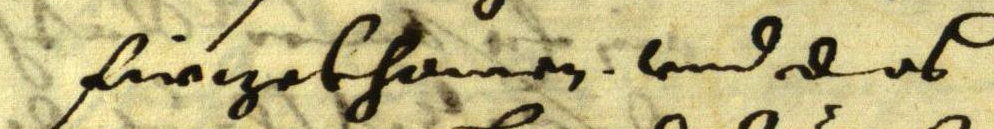firzekhomen. vnd das
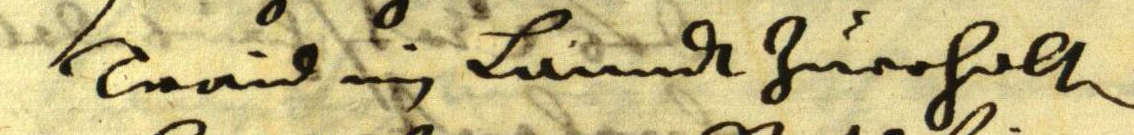Traid im Lanndt Zūerhalt.
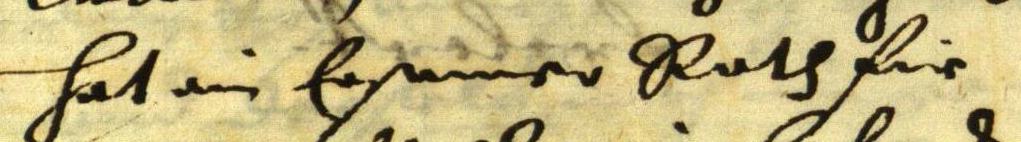hat ain Ersamer Rath fir
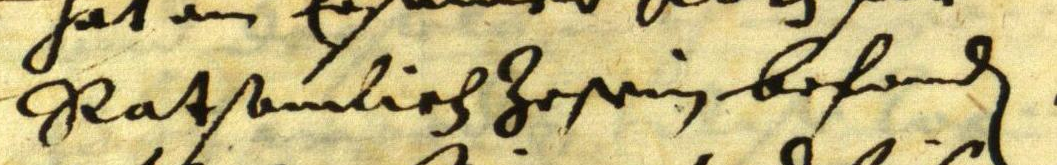Ratsamlich Zesein befond.
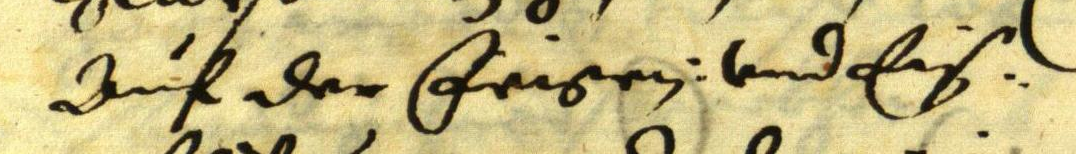Aūf der Feigen: vnd Eis¬
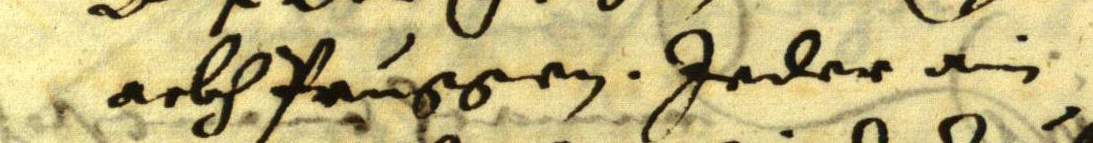ackh Prūggen. Jeder ain
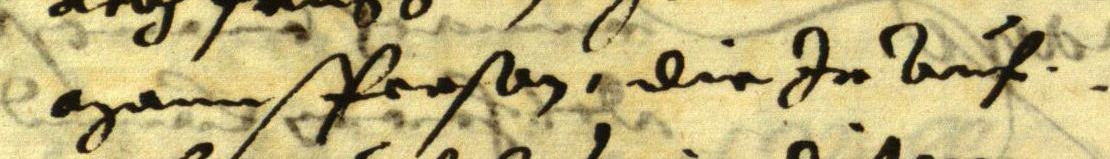Mannsperson, die Ir Aūf¬
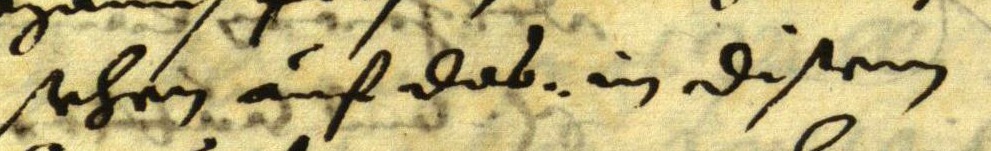sehen aūf das: in disem
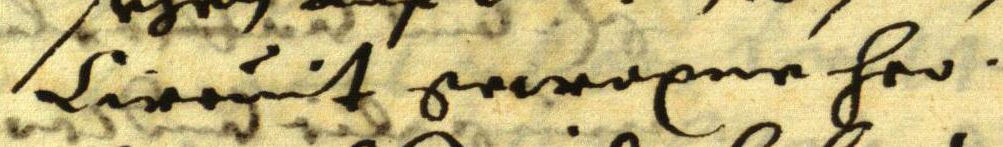Circūit gewaxne her¬
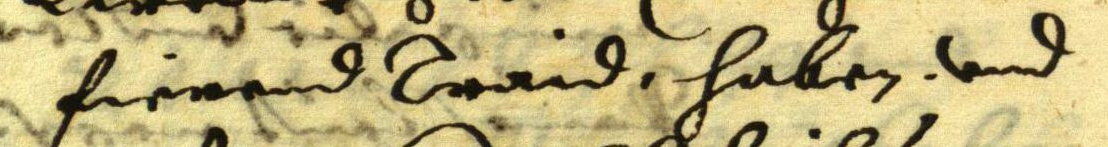fierend Traid, haben. vnd
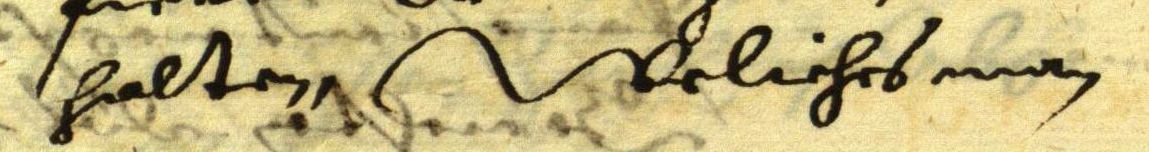halten, Weliches man
